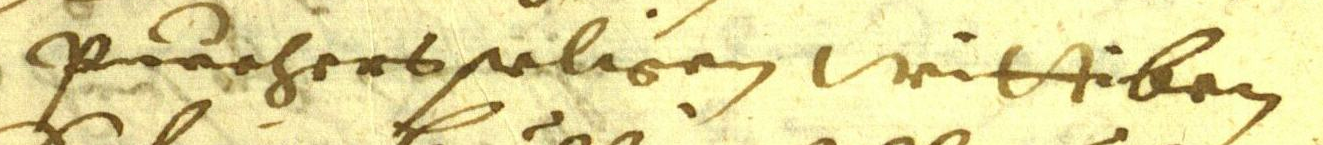Pūechers seligen wittiben
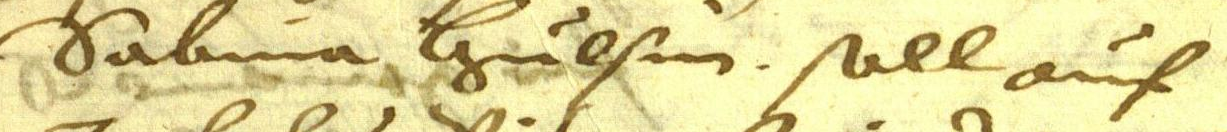Sabina Hūlfin. soll aūf
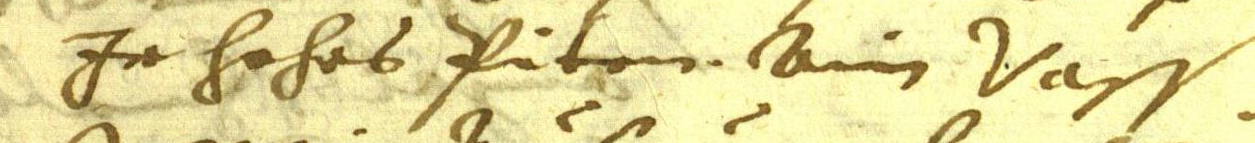Ir hohes Piten. Ain Vasß
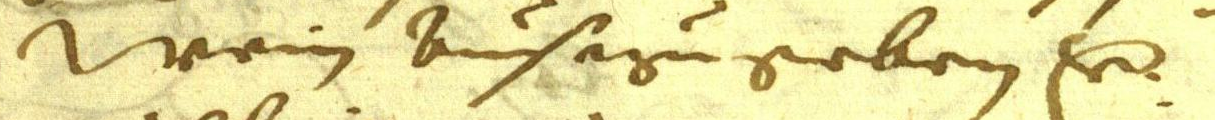Wein Aūszūgeben v¬
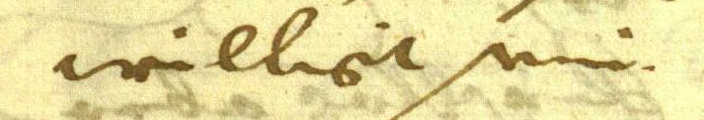willigt sein.
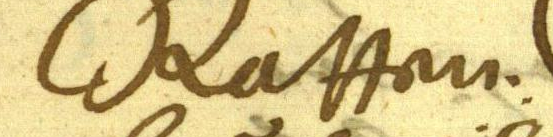Rotten¬
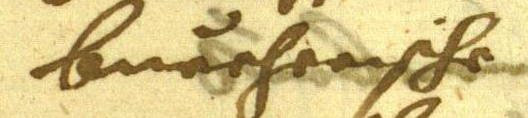būecherische
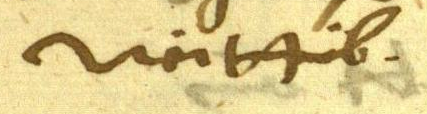wittib.
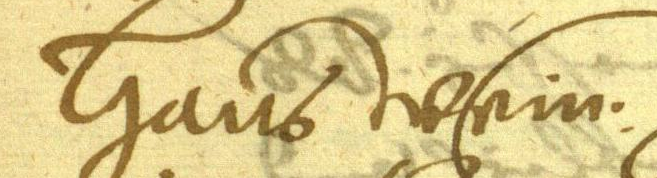Hans Wein¬
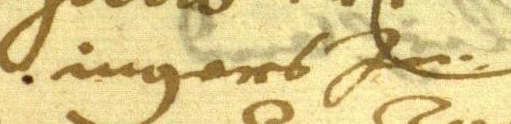ingers In¬
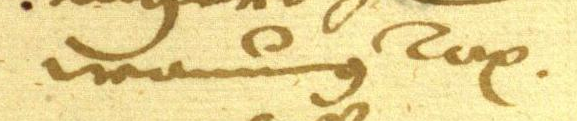wonūng Tax.
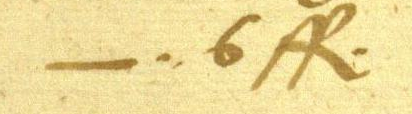—: 6 fl.
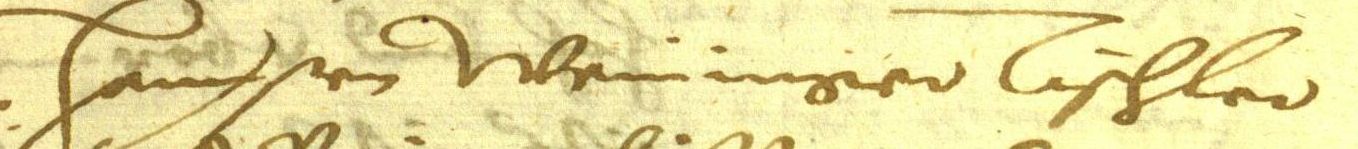hannsen Weininger Tischler
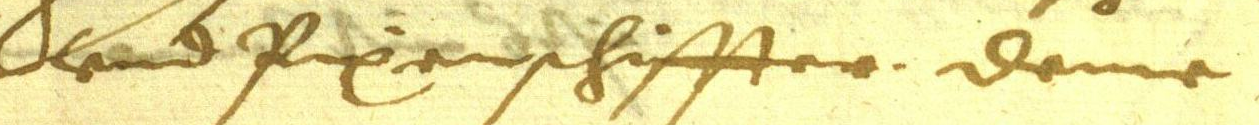vnd Pixenschiffter. deme
